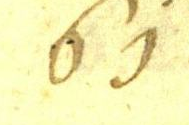61
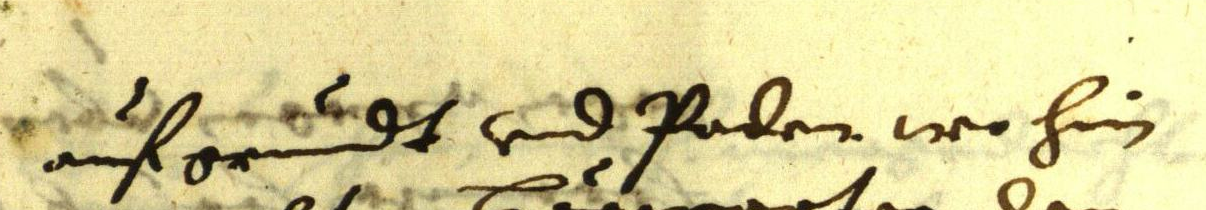aūf grūndt vnd Poden wo hin
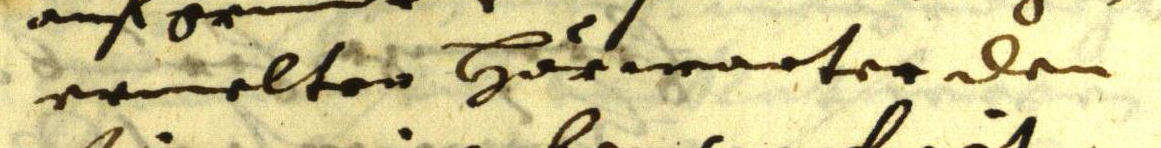ermelter Hōrwarter den
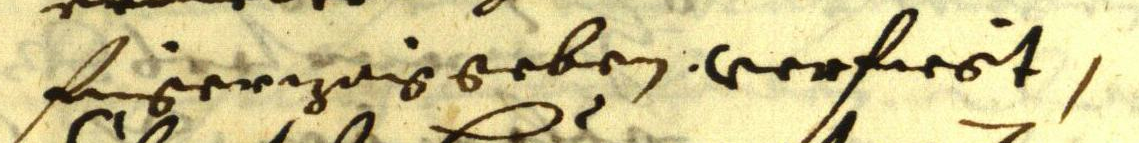fingerzaig geben. verfiegt
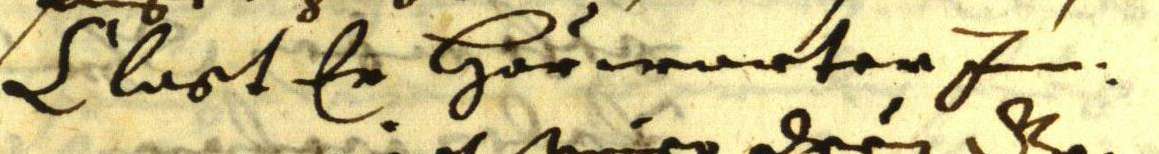Clagt Er Hōrwarter Inn¬
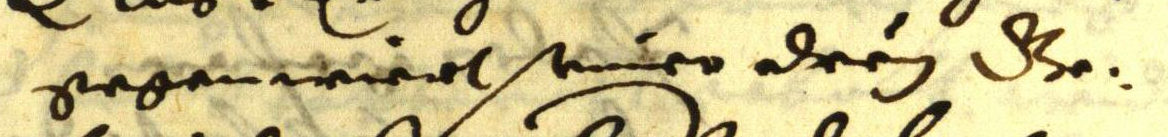gegen wiert seiner drēy Ge¬
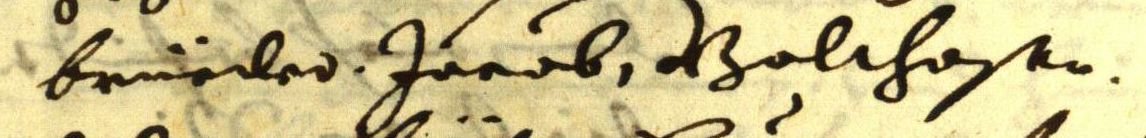brūeder Jacob, Balthasar.
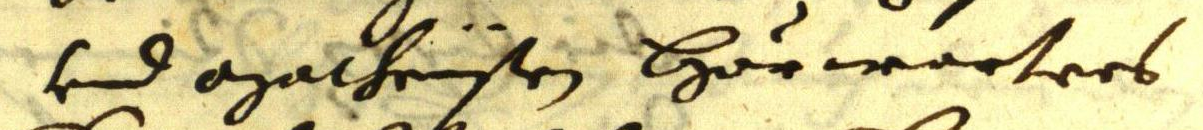vnd Matheüsen Hōrwarters
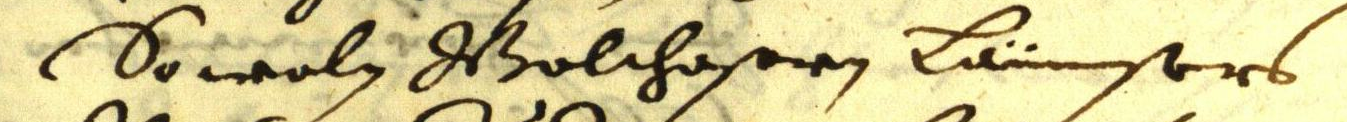So woln Balthasarn Lännsers
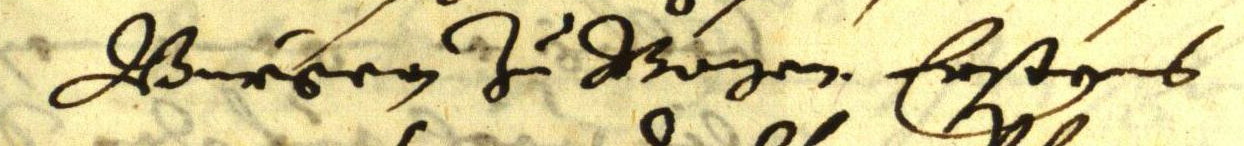Būrgern Zū Bozen. Erstens
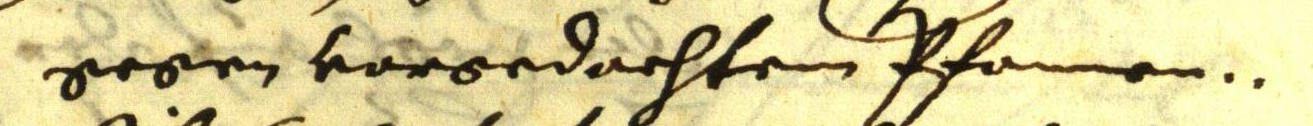gegen vorgedachtem Pfannen¬
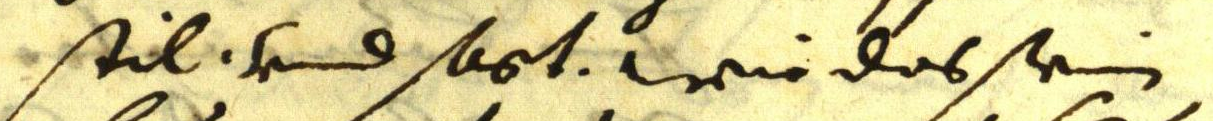stil. vnd sagt. wie das sein
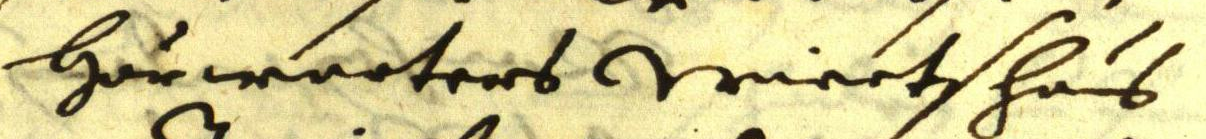Hōrwarters Wiertshaūs
